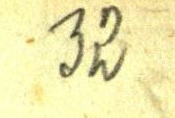32
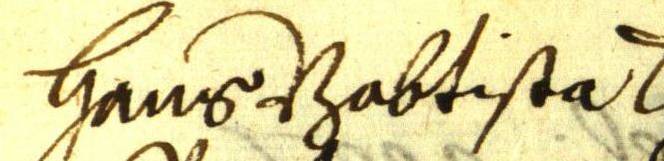Hans Babtista
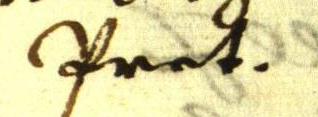Pret.
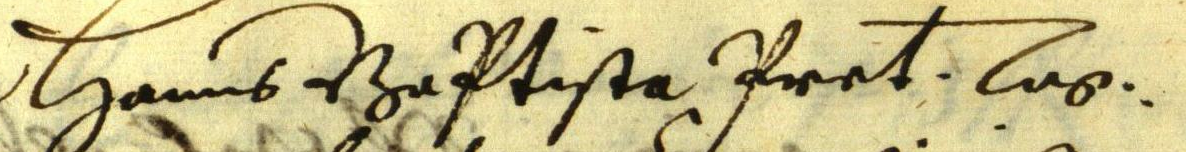Hanns BaPtista Pret. Tag¬
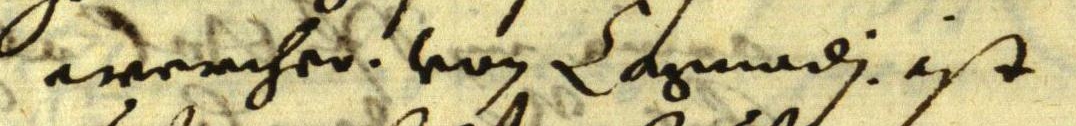wercher. von Cagnadj. ist
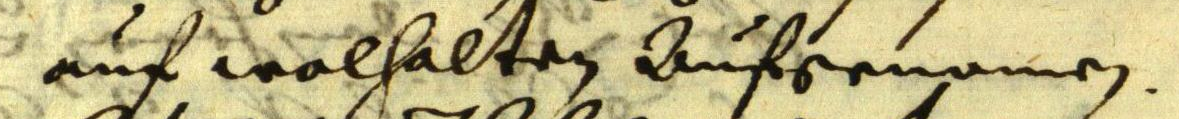aūf wolhalten Aūfgenomen.
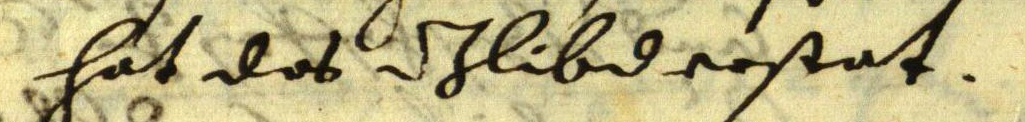hat das Glibd erstat.
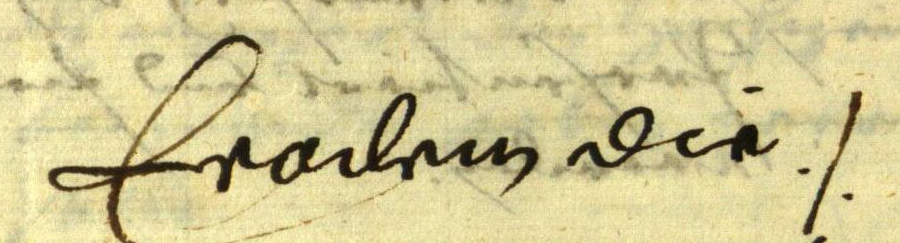Eeodem die ./.
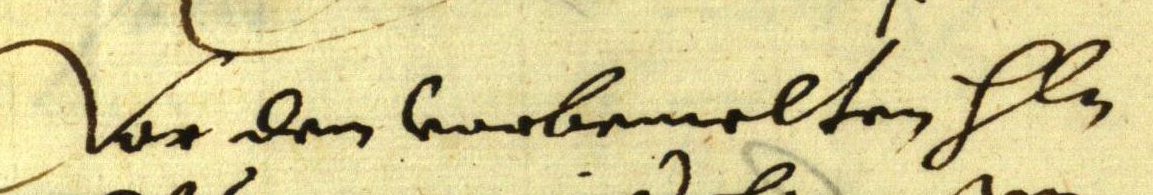Vor dem vorbemelten hln
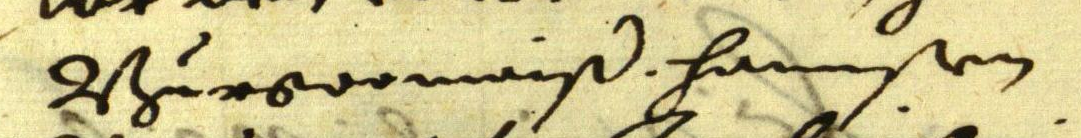Būrgermaist. hannsen
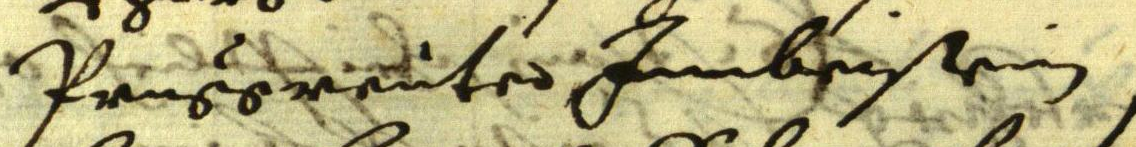Prūggreiter Innbeisein
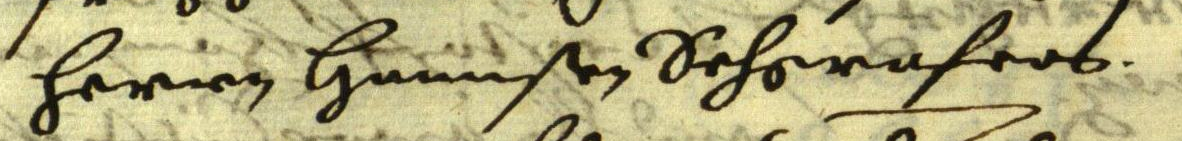herrn Hannsen Schgrafers.
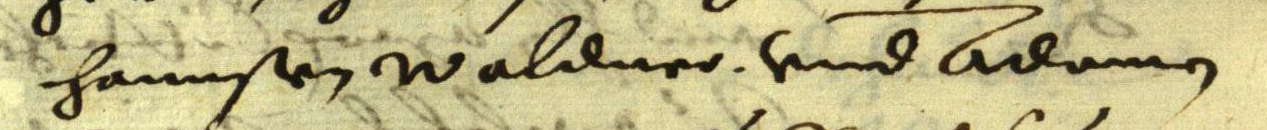hannsen waldner. vnd Adamen
